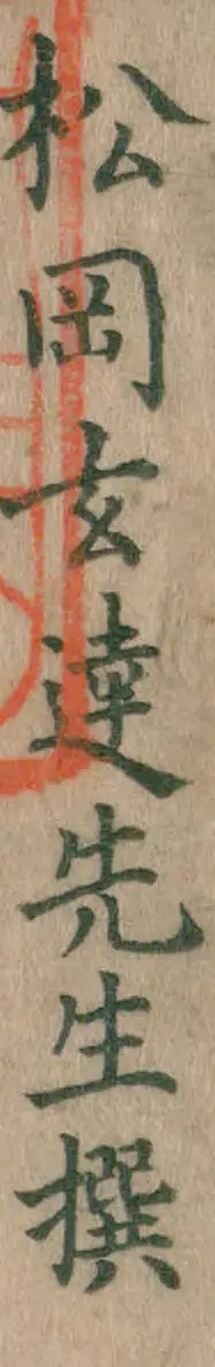松岡玄達先生撰
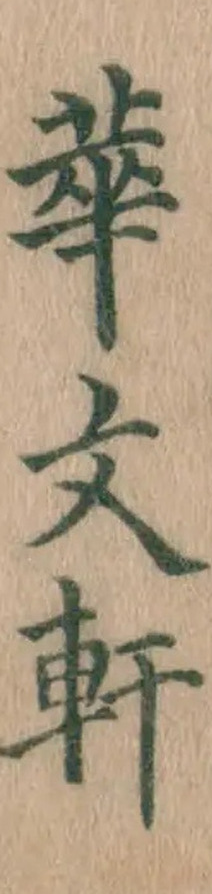華文軒
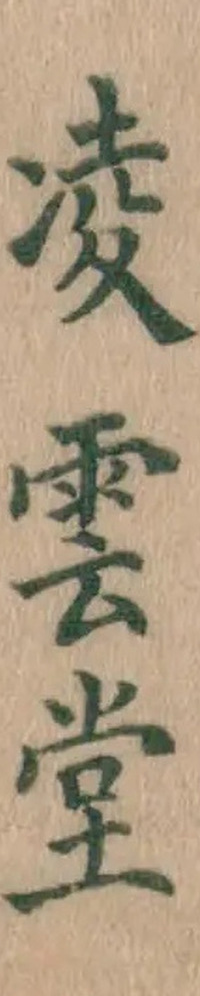凌雲堂
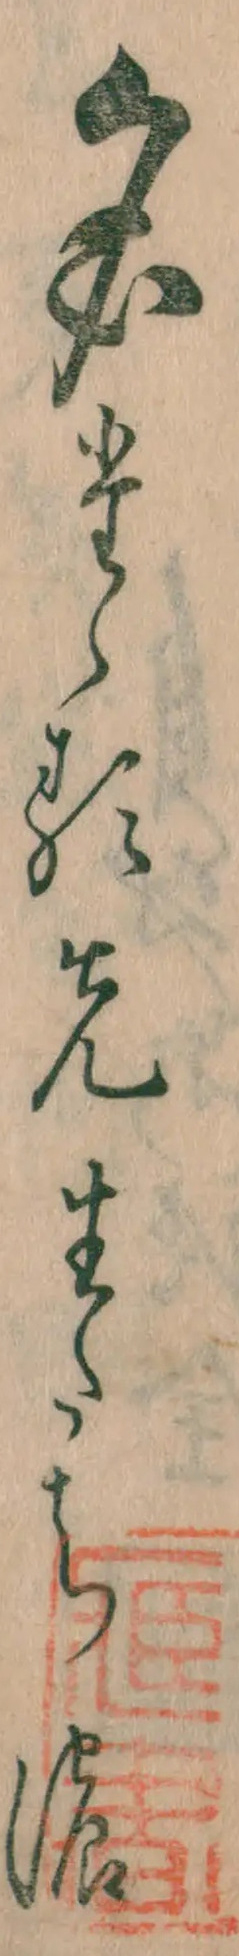名たゝる先生たちの
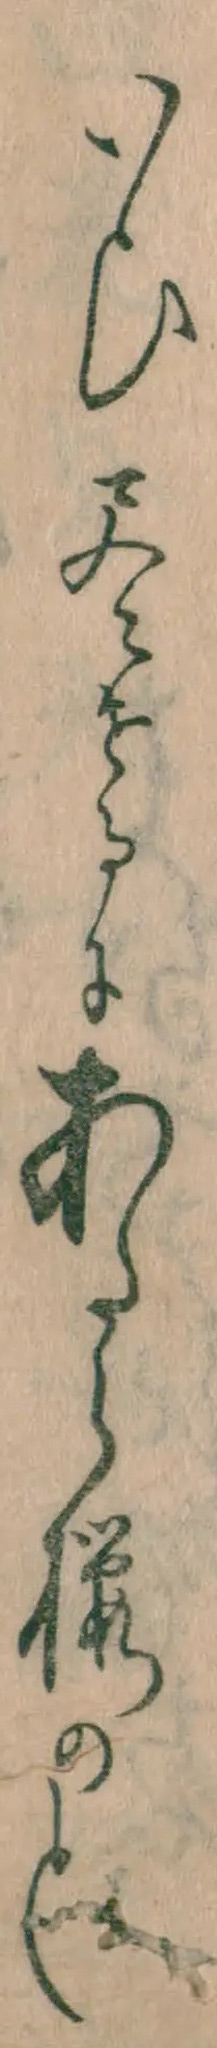いひ尽せるにあたら桜のと
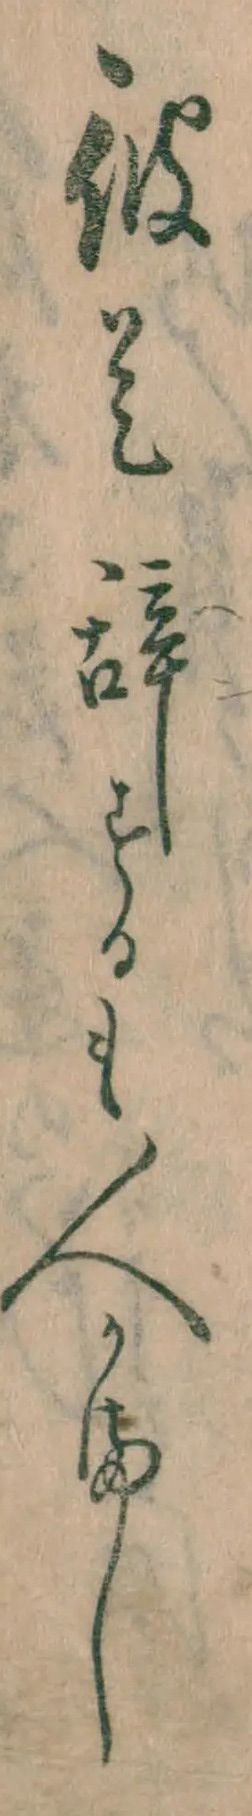彼是辞するも人かまし
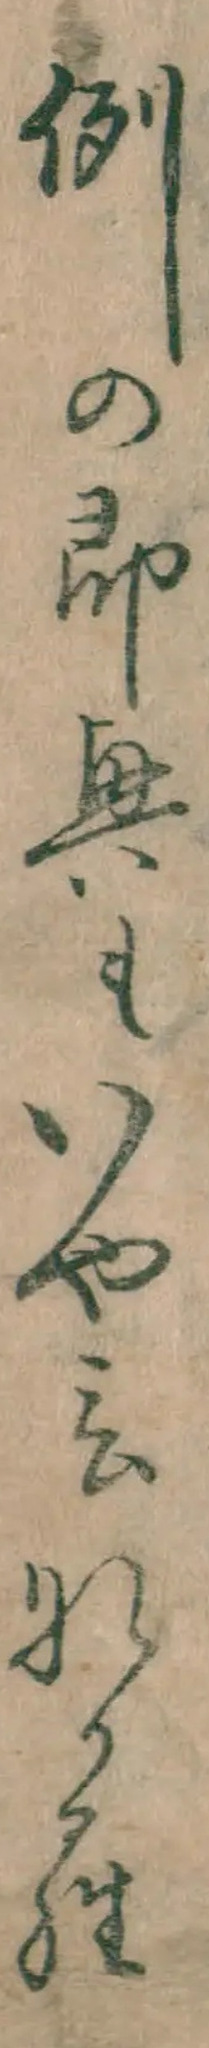例の即興もいや言なから

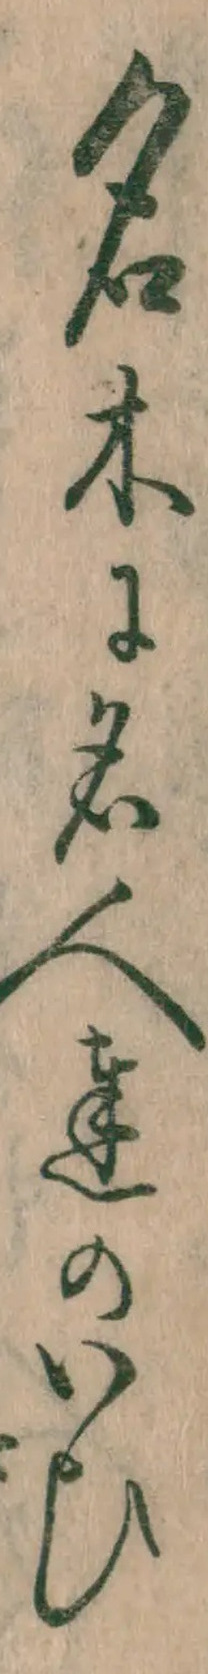名木に名人達のいひ
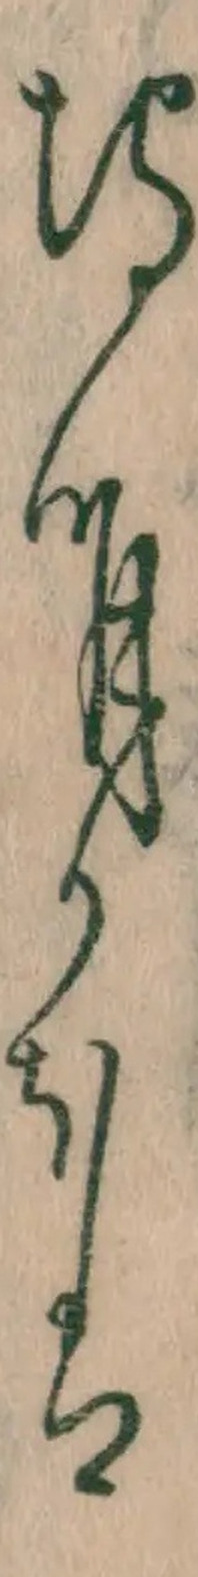埒明かほは
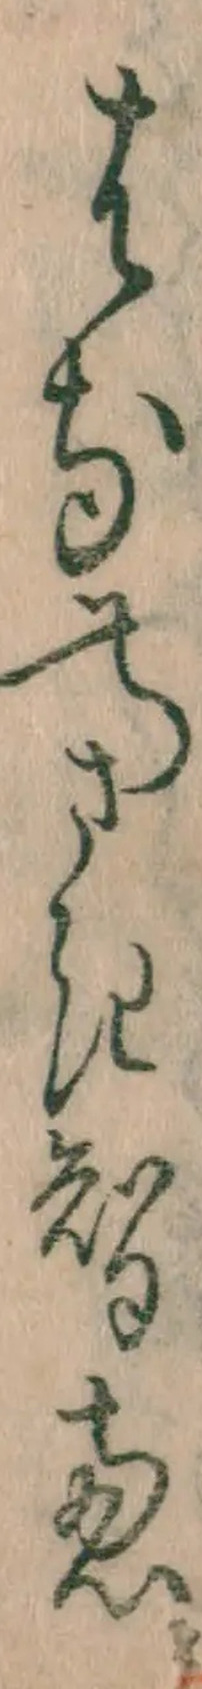はなのさき智恵
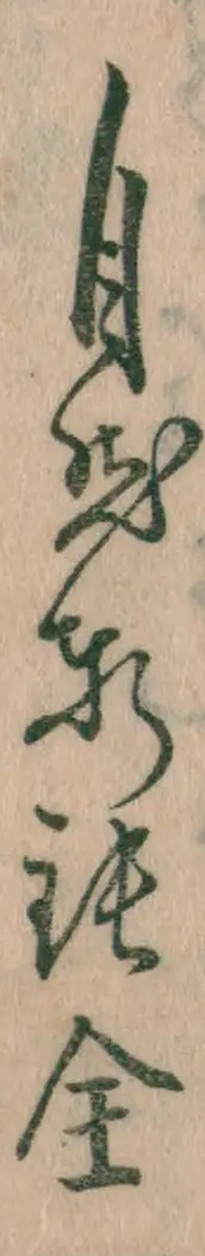自然軒鈍全
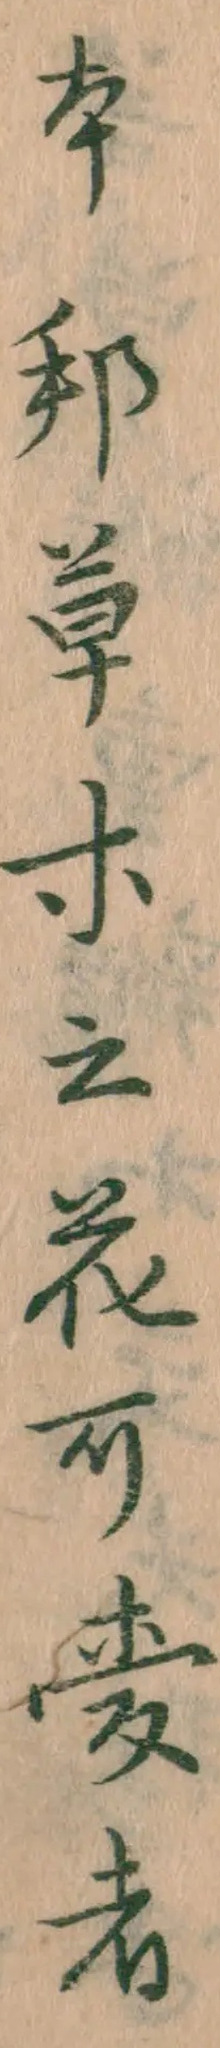本邦草木之花可愛者
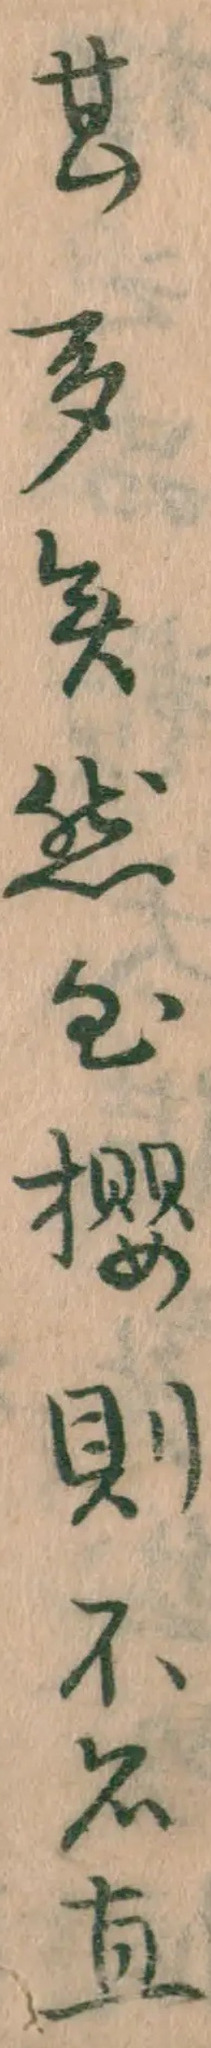甚多矣然至桜則不名直
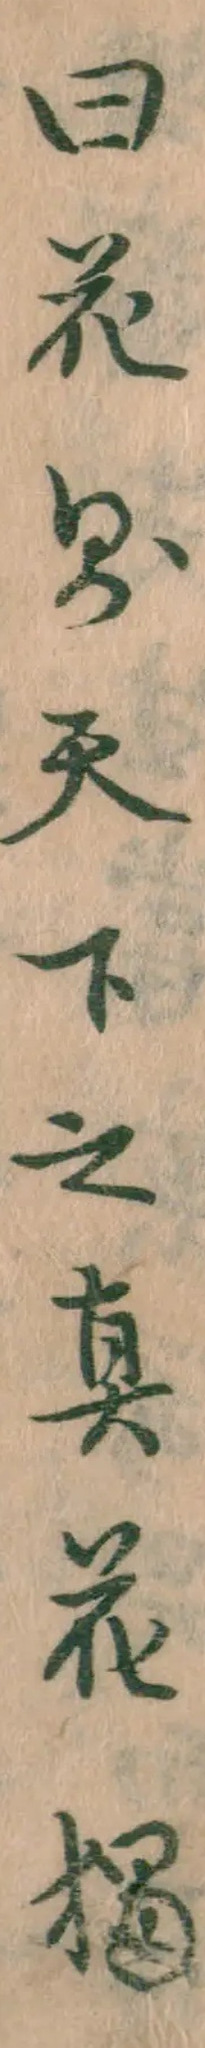曰花則天下之真花独
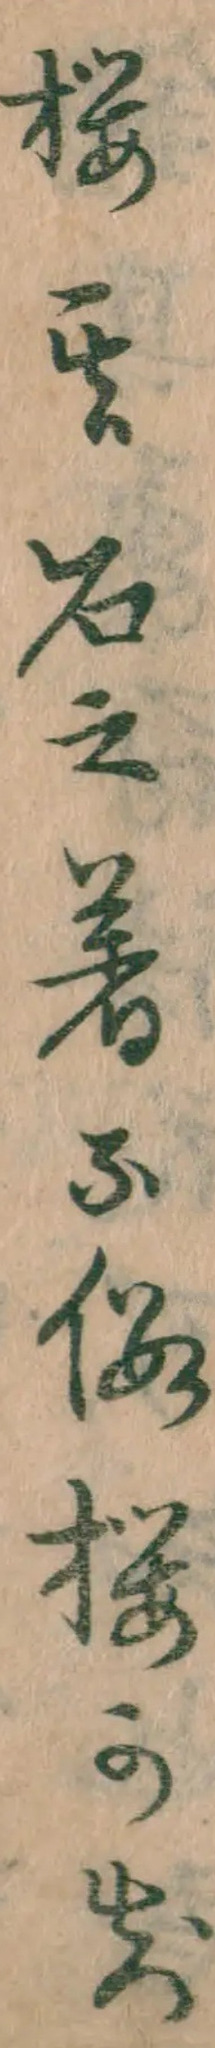桜其名之着不仮桜可知
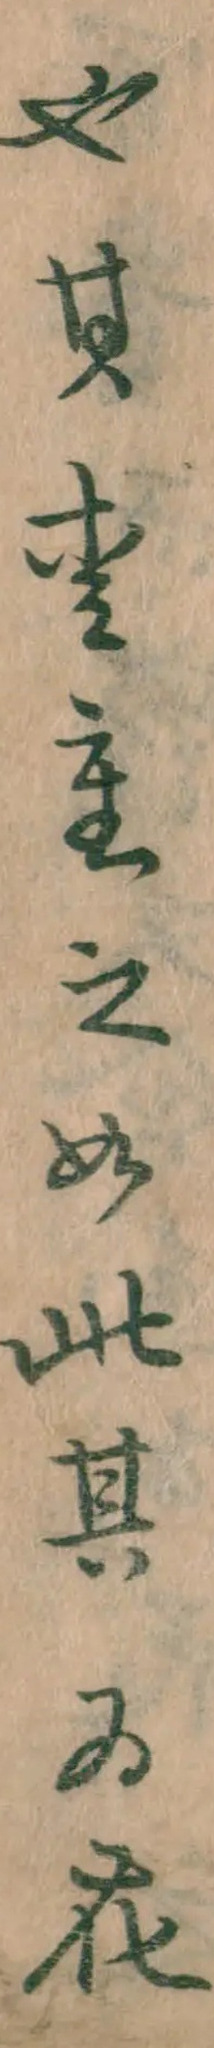也其愛重之如此其為花
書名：怡顔齋櫻品
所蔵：国立国会図書館 National Diet Library, JAPAN
